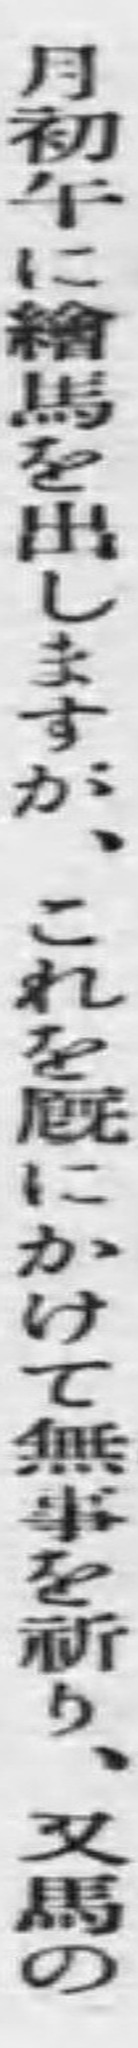月初午に絵馬を出しますが、これを厩にかけて無事を祈り、又馬の
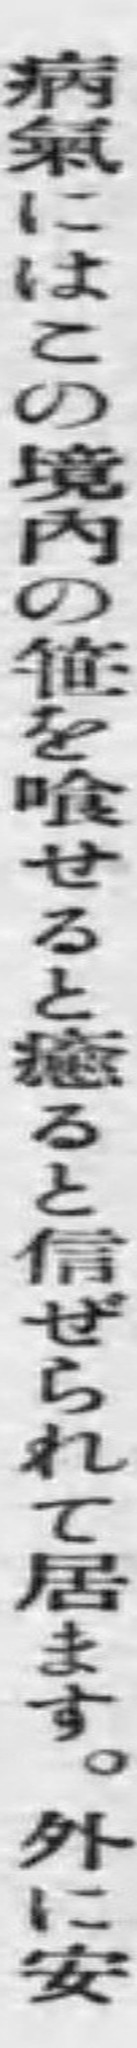病気にはこの境内の笹を喰せると癒ると信ぜられて居ます。外に安
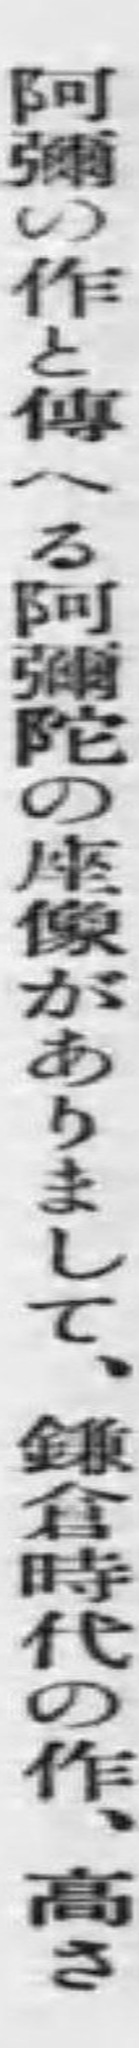阿弥の作と伝へる阿弥陀の座像がありまして、鎌倉時代の作、高さ
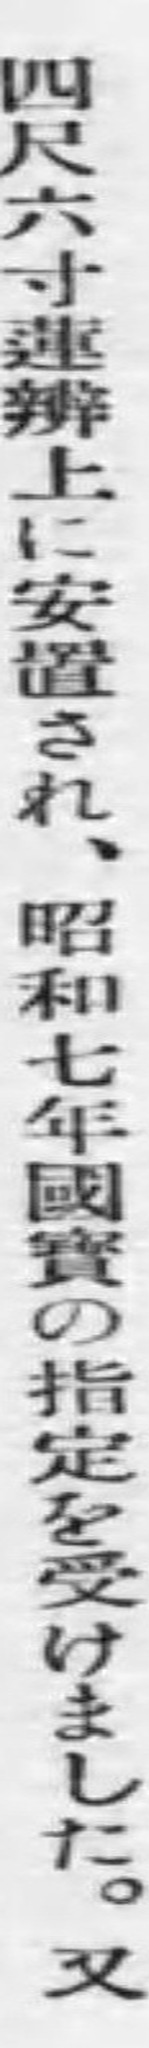四尺六寸蓮弁上に安置され、昭和七年国宝の指定を受けました。又
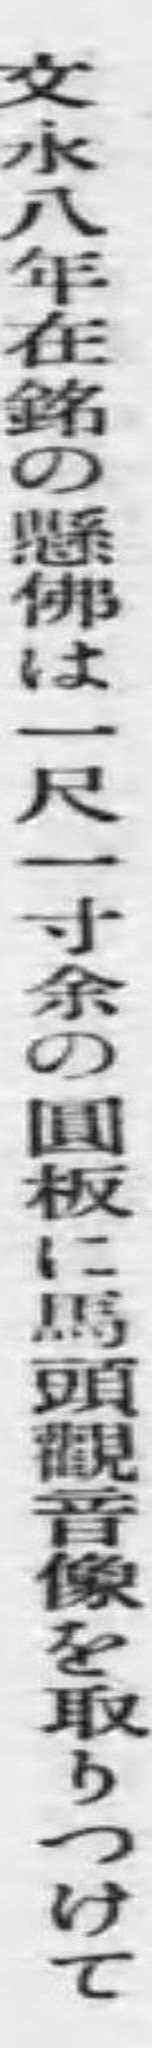文永八年在銘の懸仏は一尺一寸余の円板に馬頭観音像を取りつけて
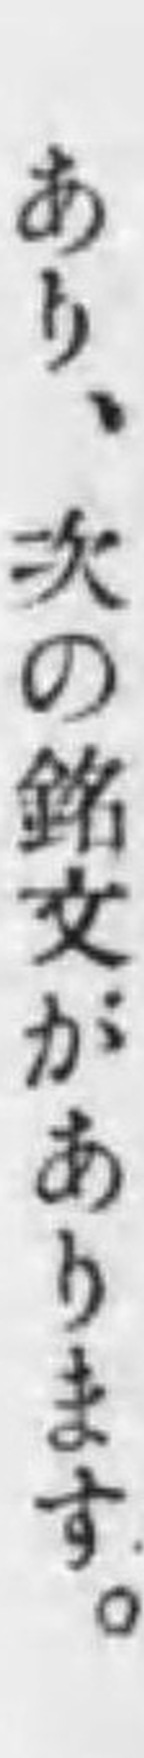あり、次の銘文があります。
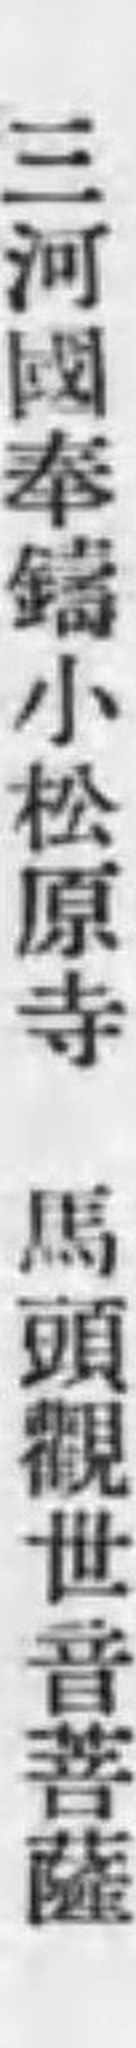三河国奉鋳小松原寺馬頭観世音菩薩
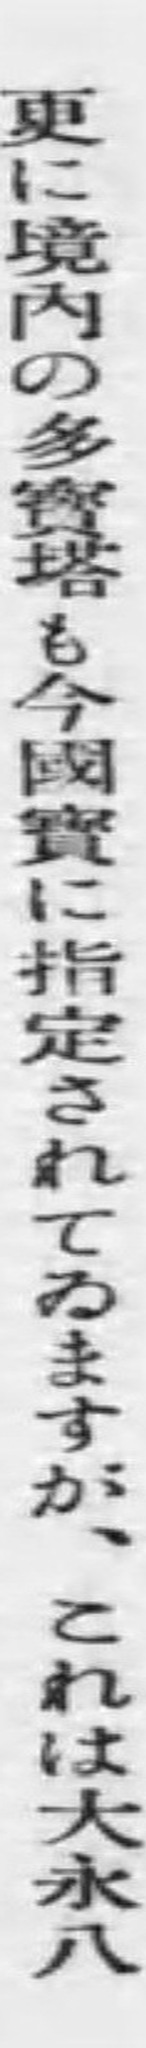更に境内の多宝塔も今国宝に指定されてゐますが、これは大永八
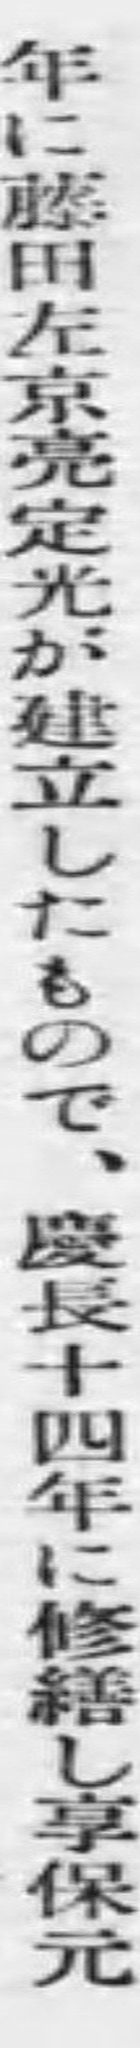年に藤田左京亮定光が建立したもので、慶長十四年に修繕し享保元
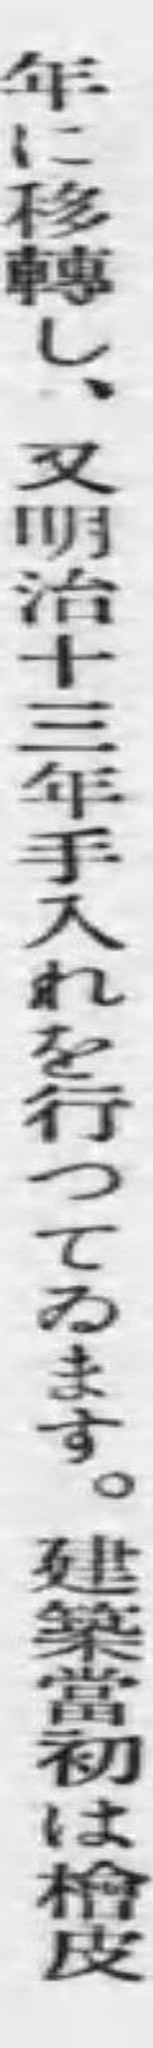年に移転し、又明治十三年手入れを行つてゐます。建築当初は檜皮
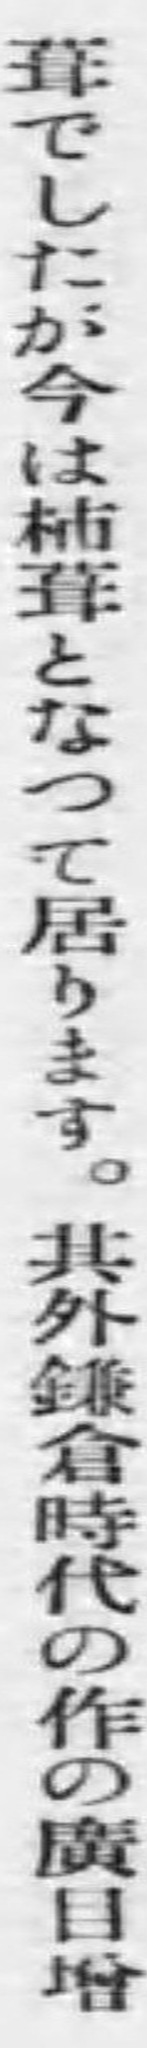葺でしたが今は杮葺となつて居ります。其外鎌倉時代の作の広目増

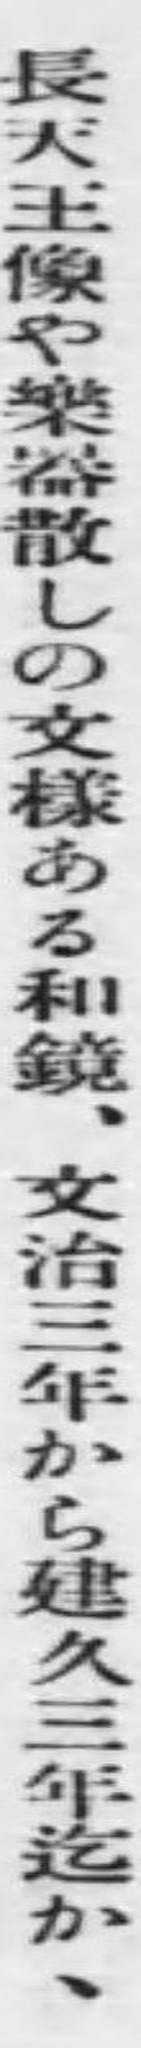長天王像や楽器散しの文様ある和鏡、文治三年から建久三年迄かゝ
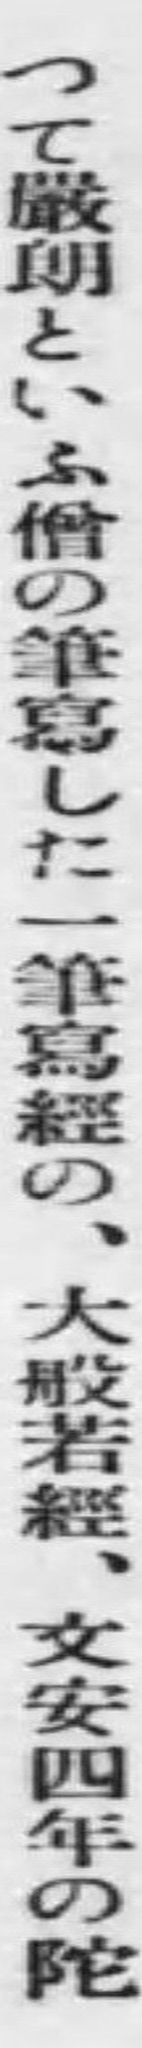つて厳朗といふ僧の筆写した一筆写経の、大般若経、文安四年の陀
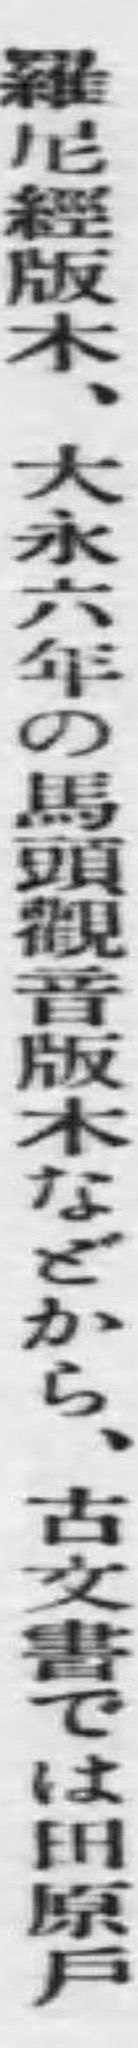羅尼経版木、大永六年の馬頭観音版木などから、古文書では田原戸
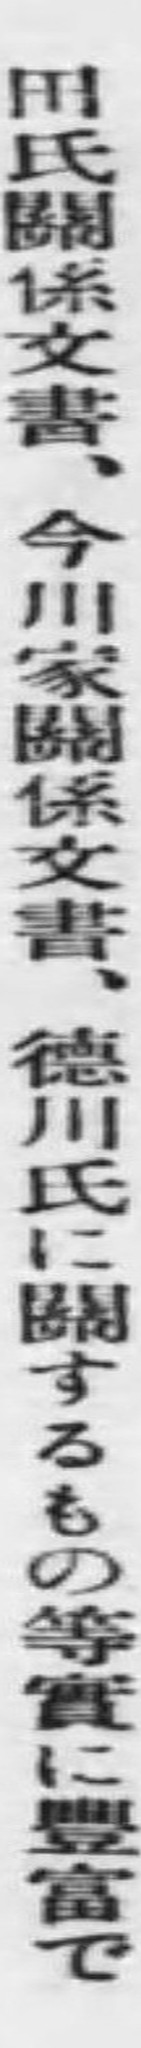田氏関係文書、今川家関係文書、徳川氏に関するもの等実に豊富で
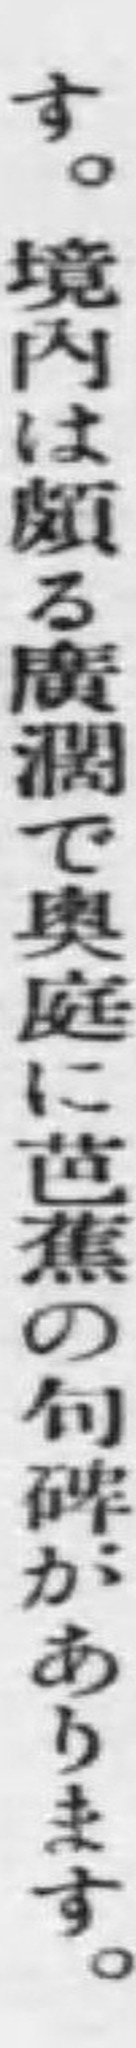す。境内は頗る広濶で奥庭に芭蕉の句碑があります。
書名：東三河道中記 : 豊橋市及其附近案内
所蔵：国立国会図書館 National Diet Library, JAPAN
